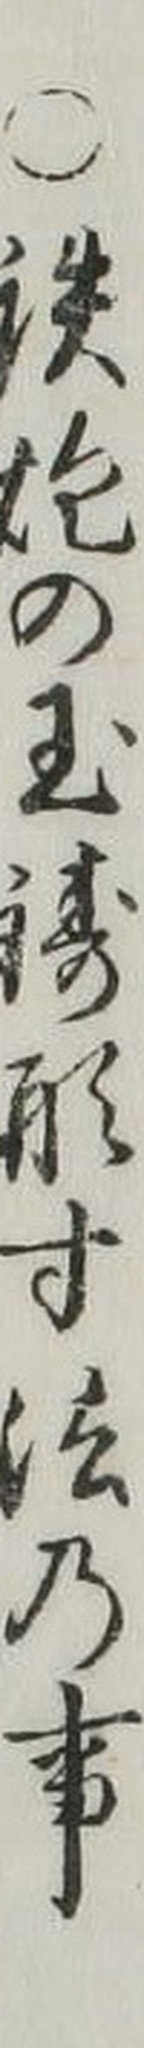○鉄炮の玉鋳形寸法の事

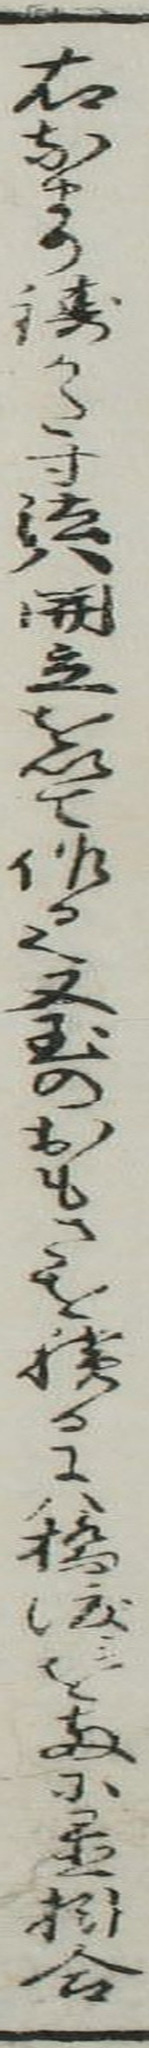右なまり鋳かた寸法は開立を以て作る也又玉のおもさを積るには橋渡シを両に置掛合
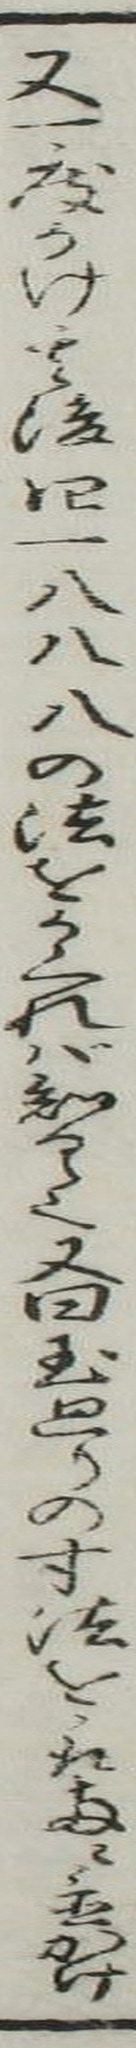又一度かけ其後四一八八八の法をかくれば知るゝ也又曰玉廻りの寸法を取両に置かけ
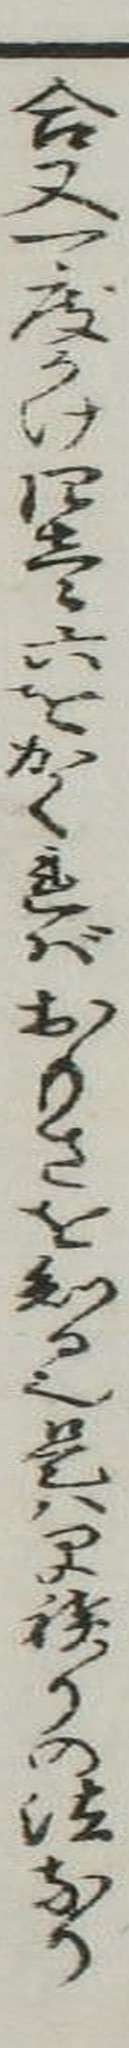合又一度かけ四壱六をかくればおもさを知る也是は早積りの法なり
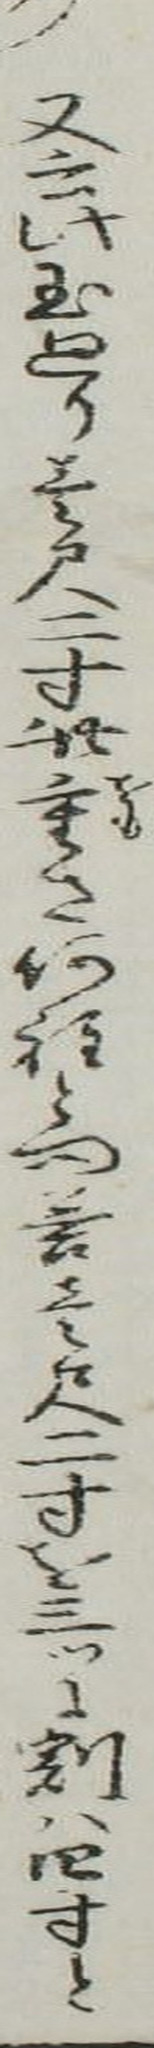まわり又云此玉廻り壱尺二寸此重さ何程と問答壱尺二寸を三ツに割は四寸と
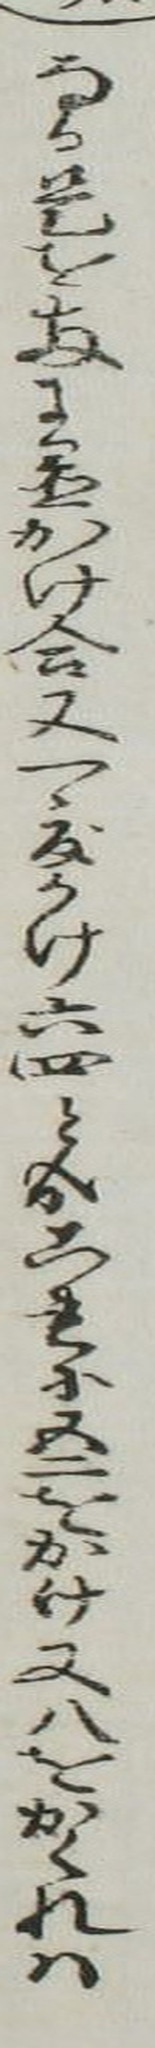鉛玉なる此を両に置かけ合又一度かけ六四と成これに五二をかけ又八をかくれは
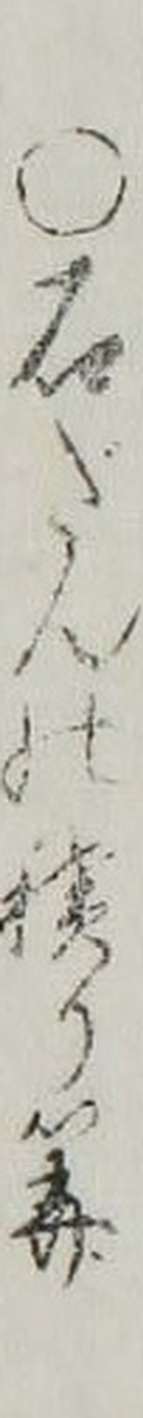○石だんの積り算
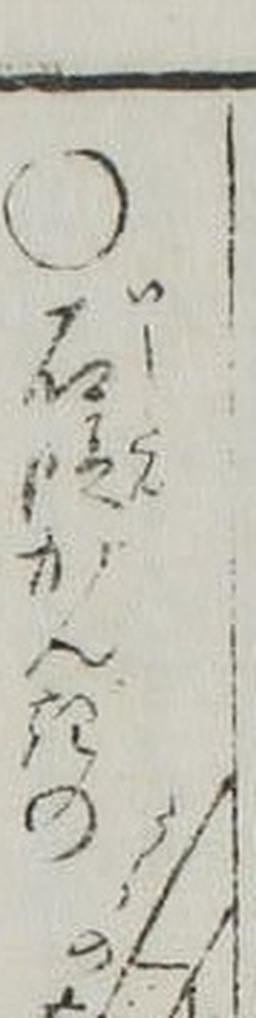○石段がんぎの
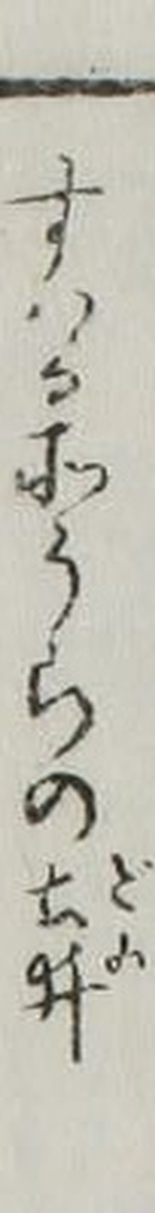すはる所からの土井
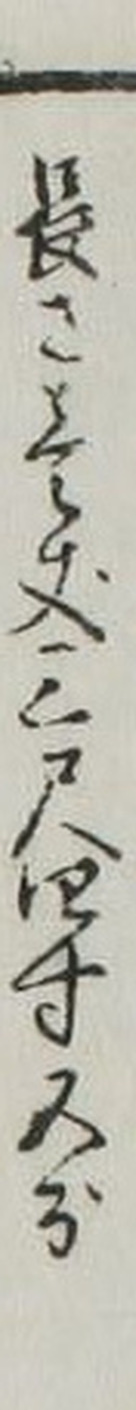長さ壱丈三尺四寸五分
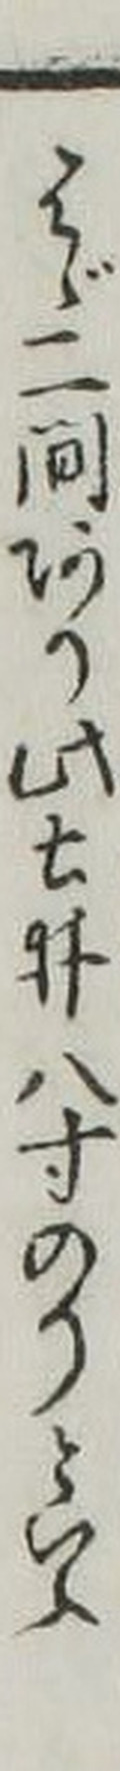はゞ二間あり此土井八寸のりといふ
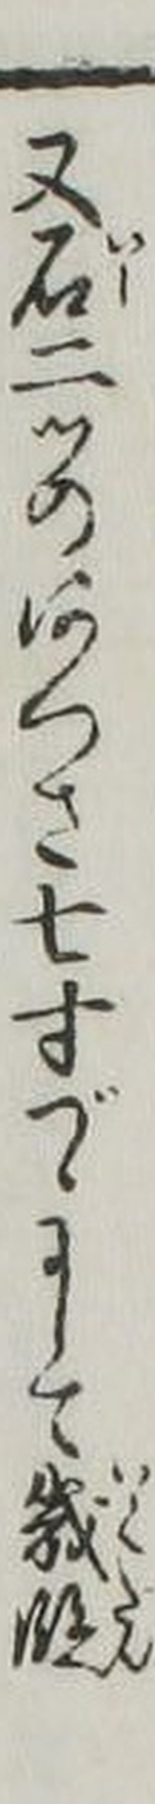又石二ツのあつさ七寸づゝにして幾段
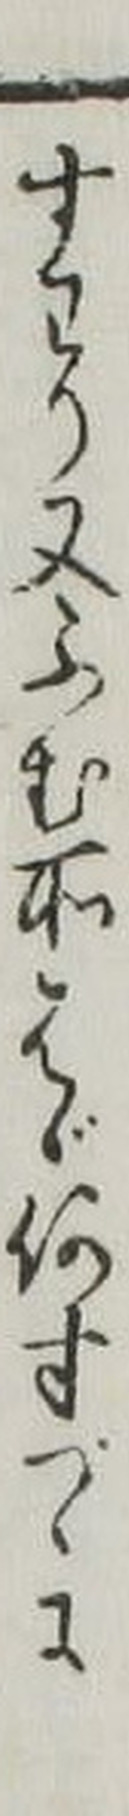すわり又ふむ所はゞ何寸づゝに
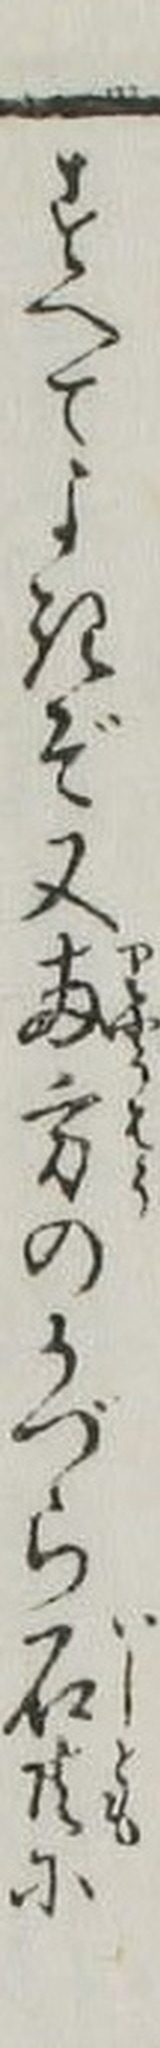すへてよきぞ又両方のかづら石共に
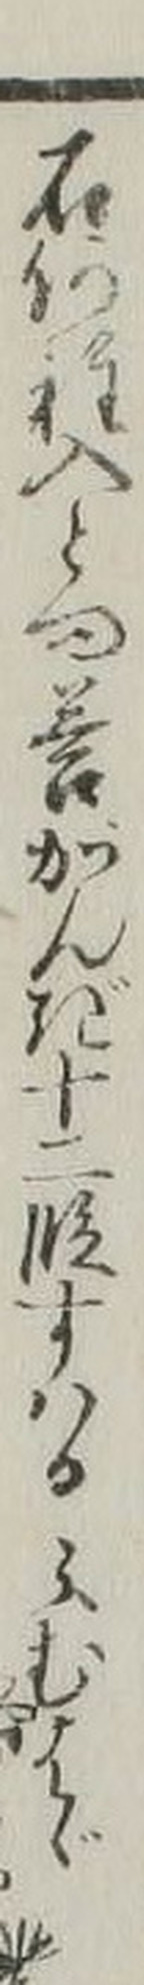石何程入と問答がんぎ十二段すはるふむはゞ
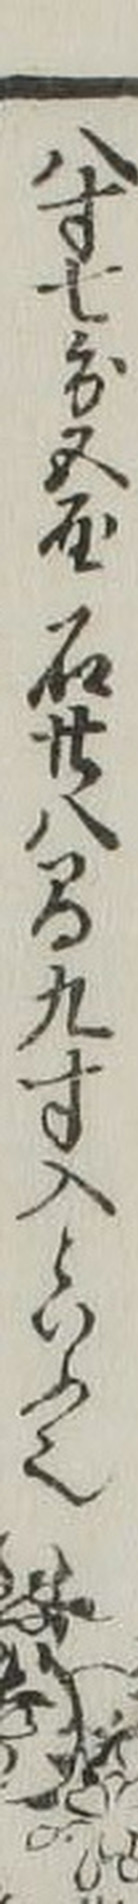八寸七分五厘石廿八間九寸入といふ也
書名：宝玉塵劫記
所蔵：東京学芸大学教育コンテンツアーカイブ
